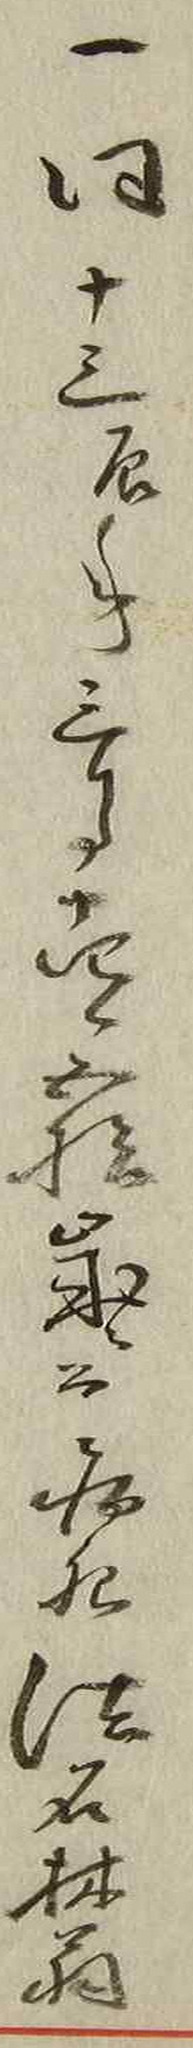一同十三辰年三月十四日五拾歳に而病死法名林翁
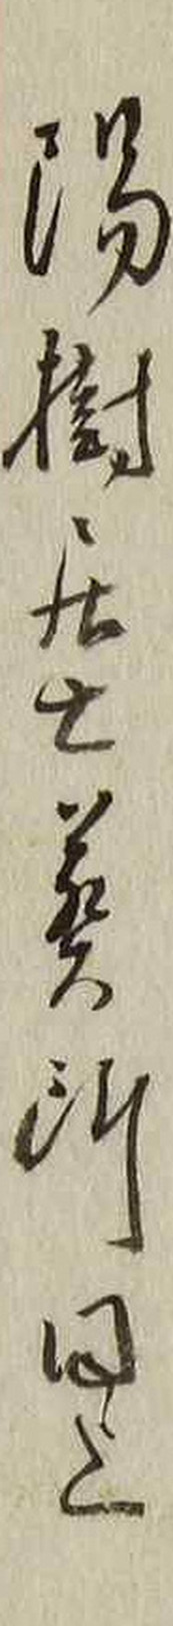陽樹居士葬所同上
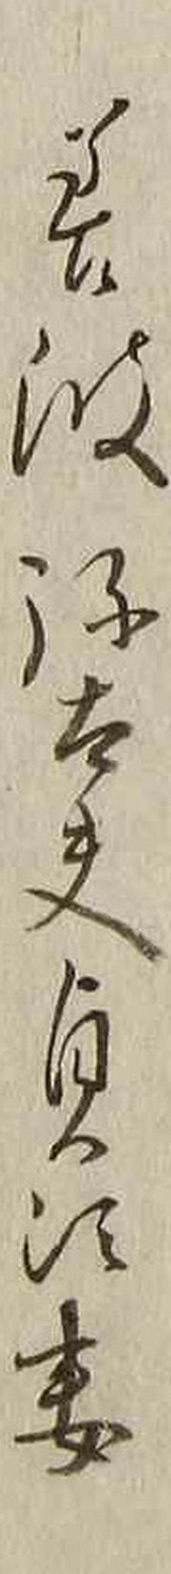女善波弥太夫貞次妻
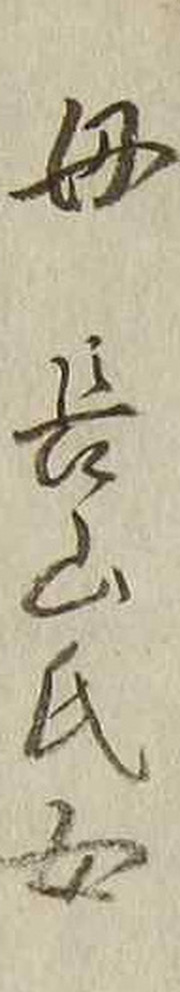母長山氏女
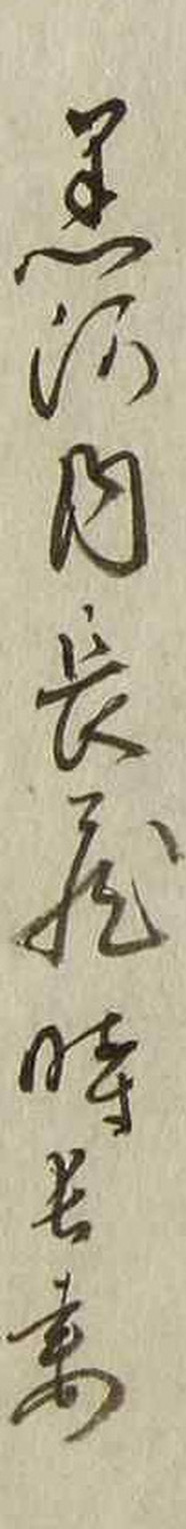女黒河内長蔵時長妻

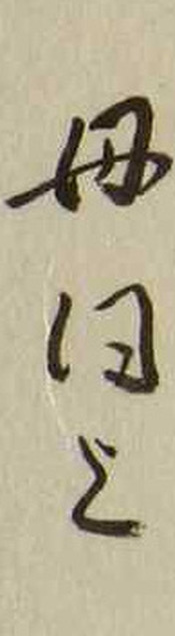母同上
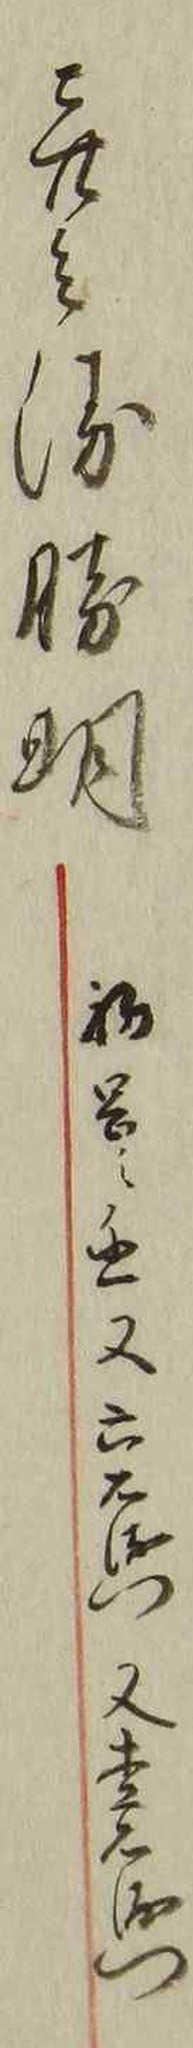喜兵衛勝明初岡之丞又六右衛門又杢右衛門
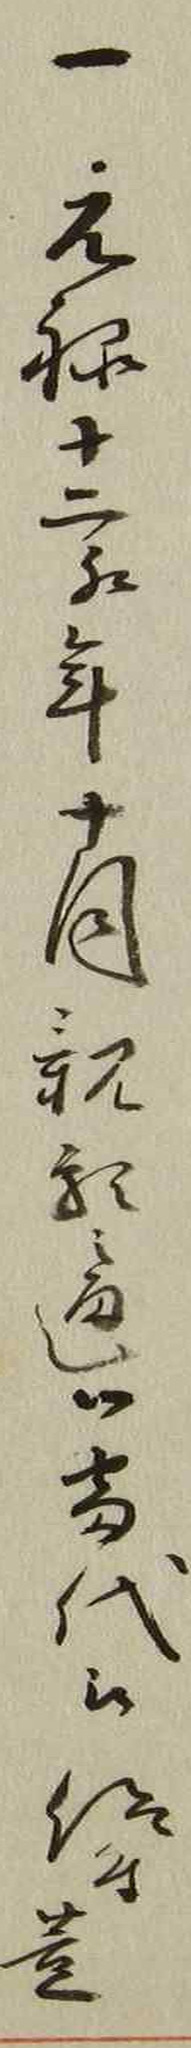一元禄十二酉年十月親願之通御番代被仰付萱
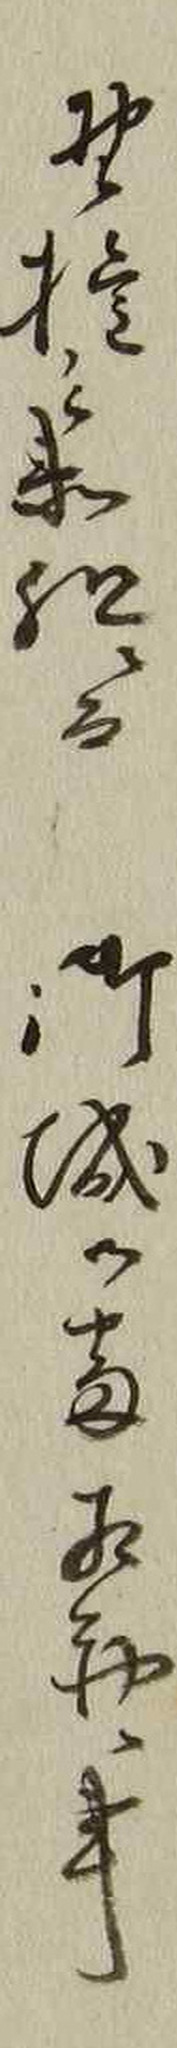野権兵衛組に而御城御番相勤候事
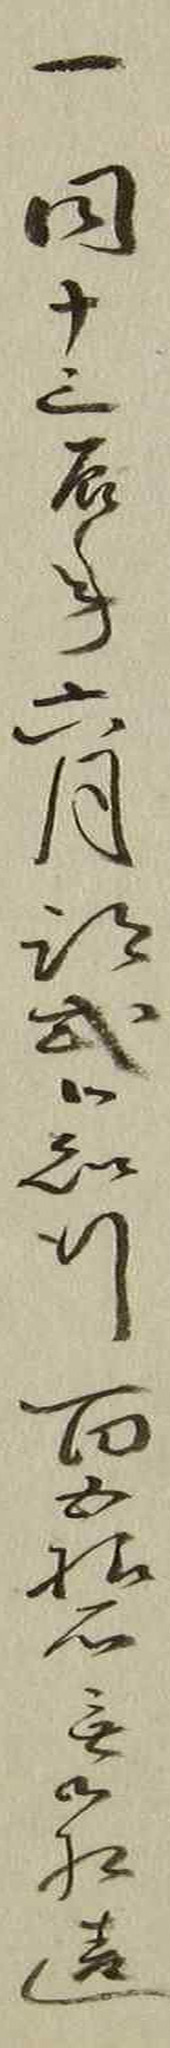一同十三辰年六月跡式御知行百五拾石無御相違
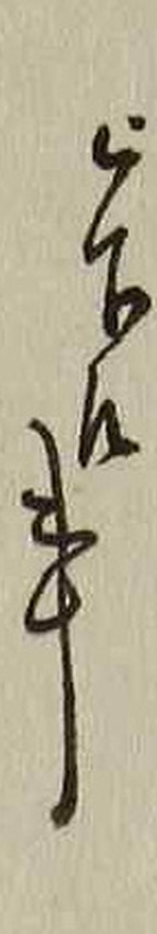被下候事
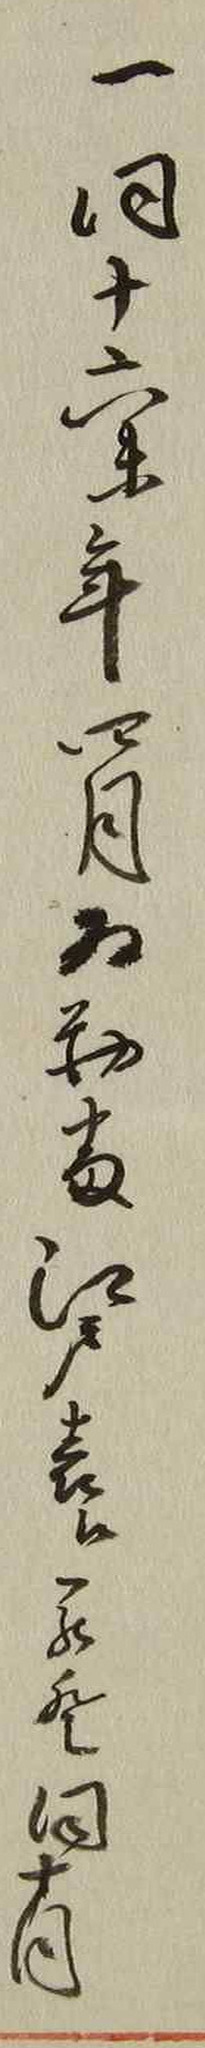一同十六未年四月為勤番江戸表江罷登同十月
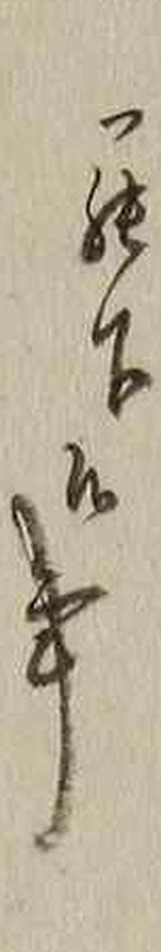罷下候事
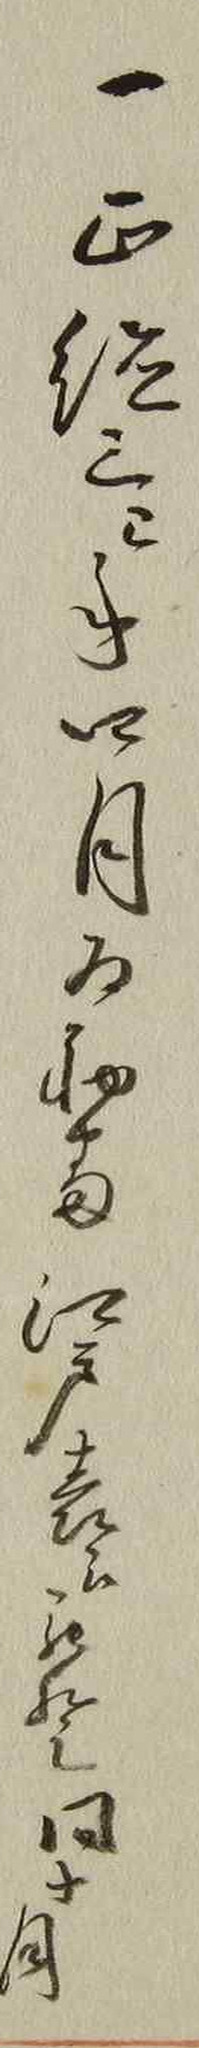一正徳三巳年四月為勤番江戸表江罷登同十月
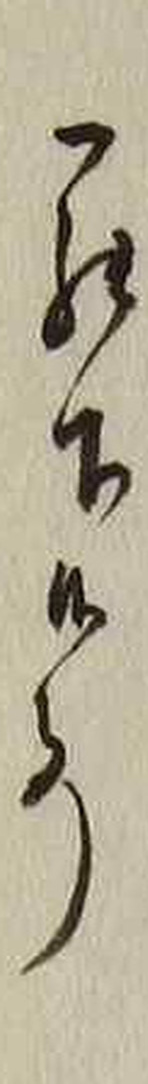罷下候事
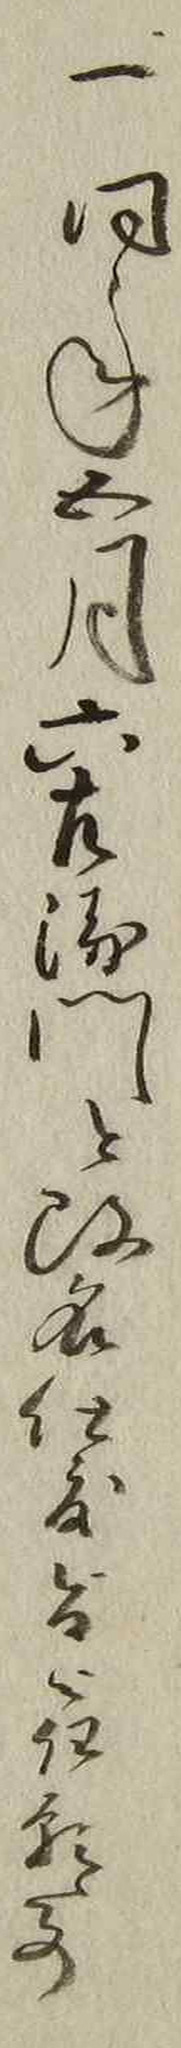一年五月六右衛門と改名仕度旨被任願候事
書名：諸士系譜　巻之6　い之部6
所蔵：会津若松市立会津図書館
